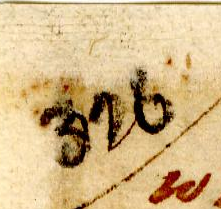326
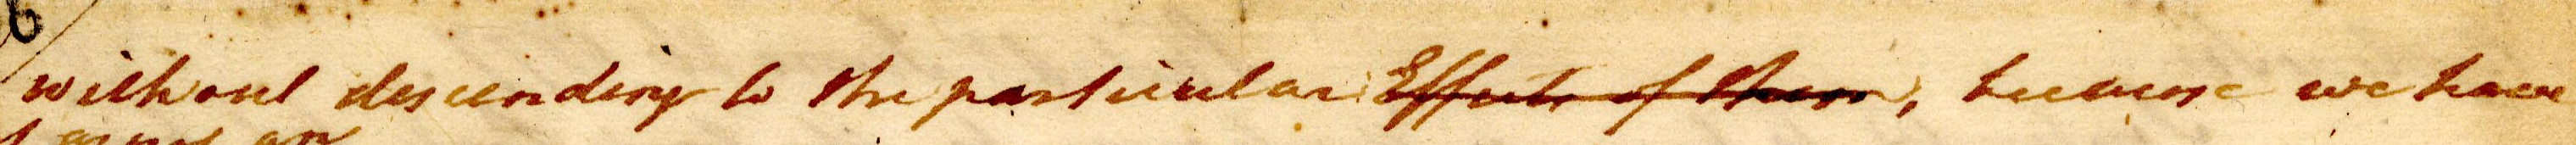without descending to the particular [Effects of them], because we have
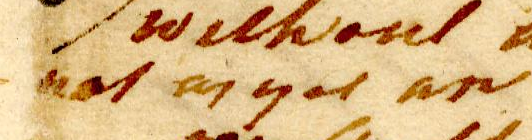not as yet an
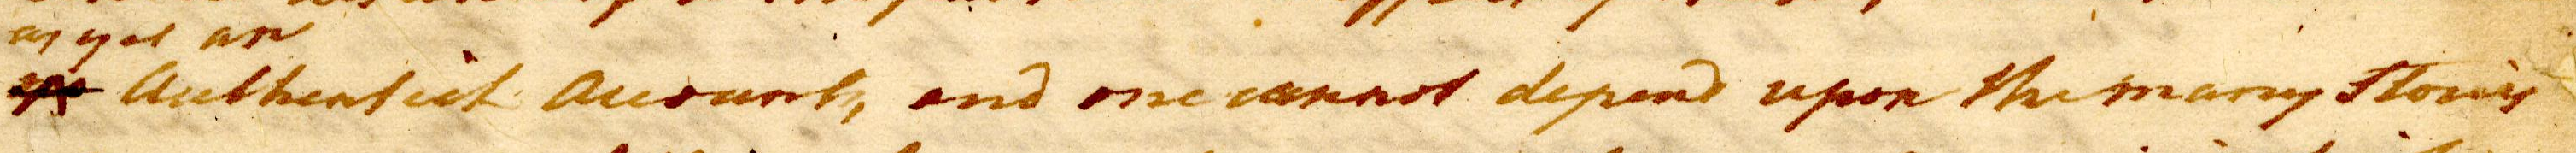[__] Authentic account, and one cannot depend upon the many Stories
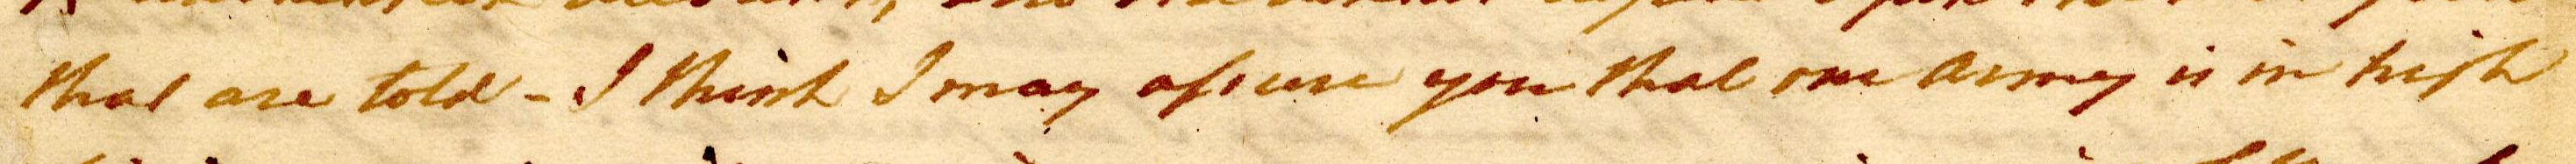that are told- I think I may assure you that our Army is in high
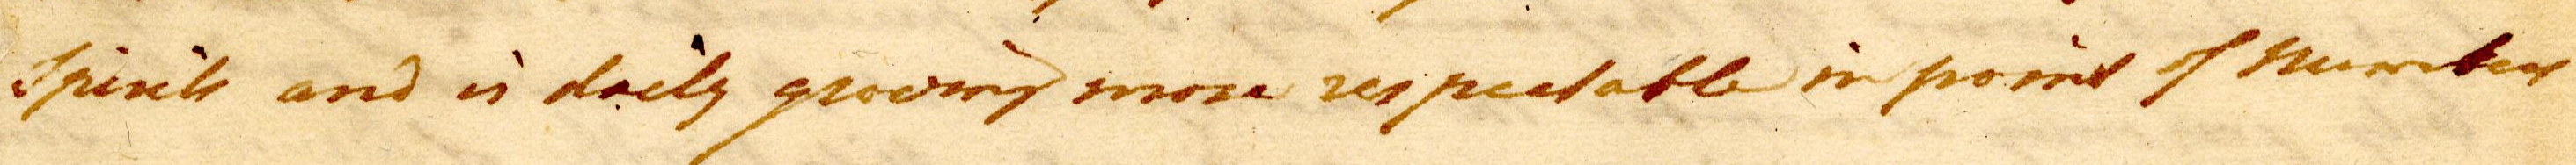Spirits and is daily growing more respectable in point of numbers.
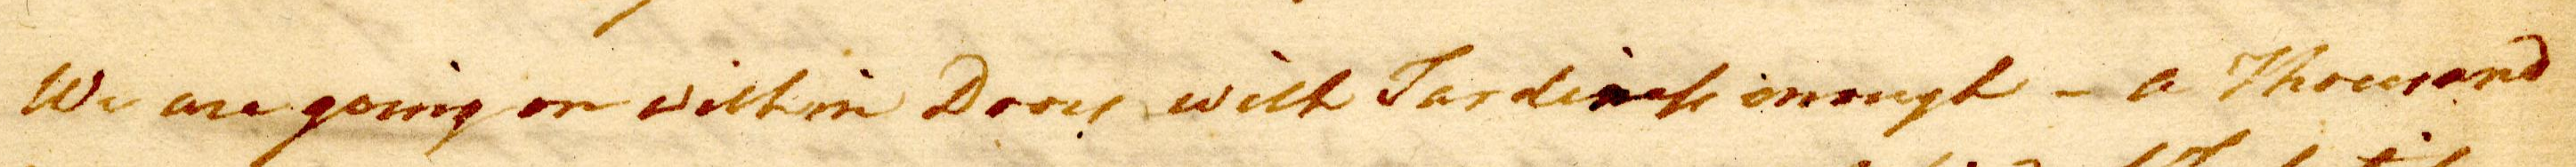We are going on within Doors with Tardiness enough- A Thousand
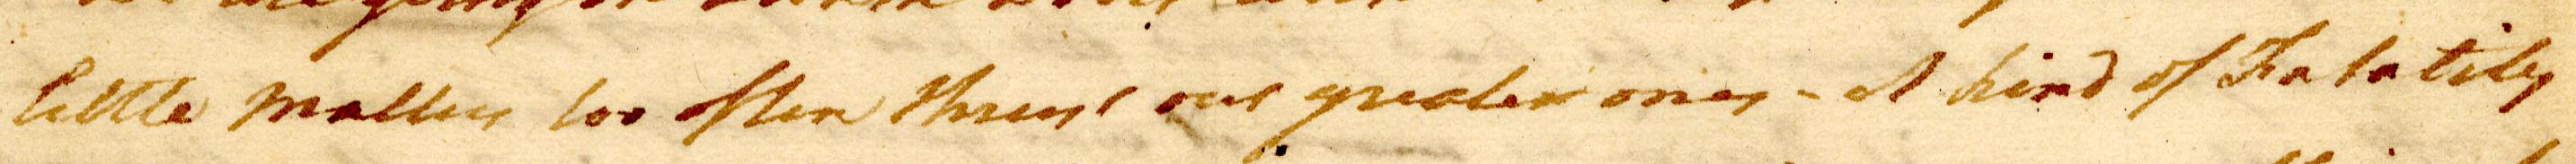little matters too often theyr our greater ones- A kind of Fatality
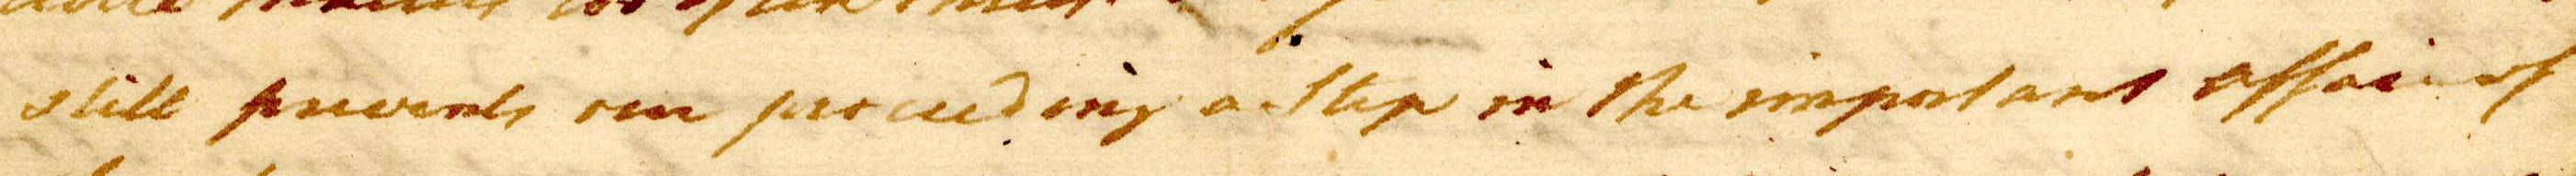still prevents our proceeding a step in the important affairs of
